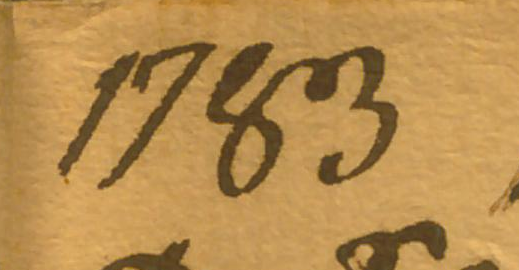1783
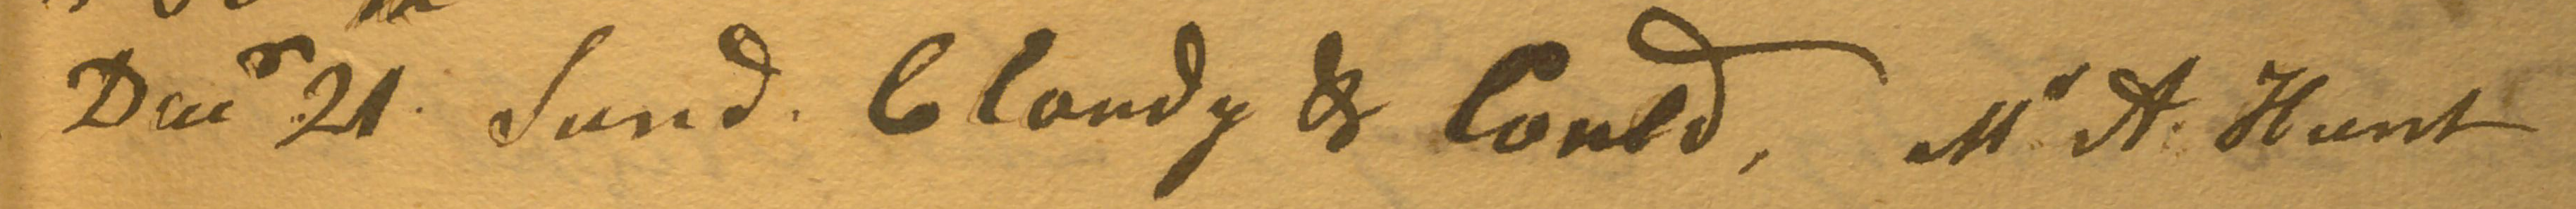Dece^r 21^th. Sund. Cloudy & Could M^r. A. Hunt
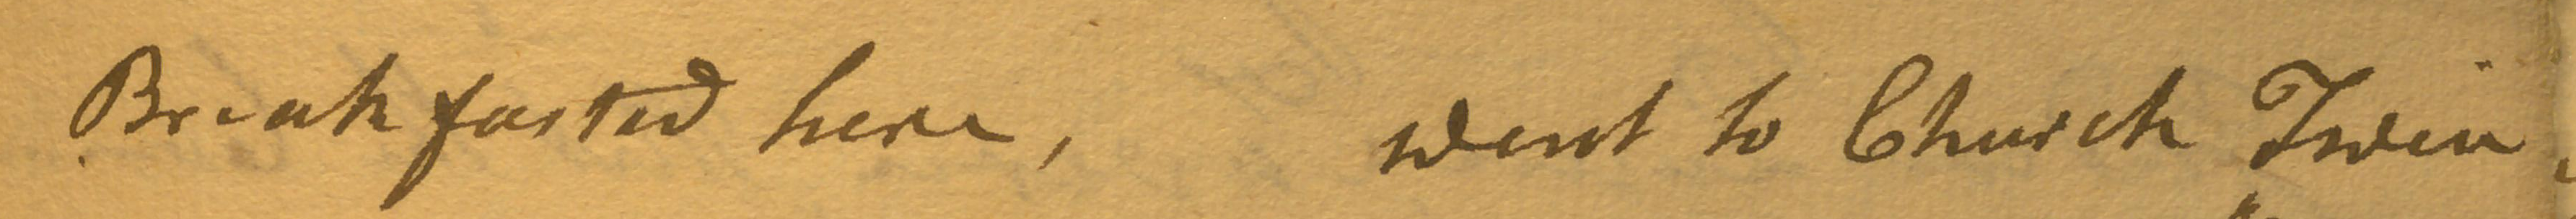Breakfasted here, went to Church Twice
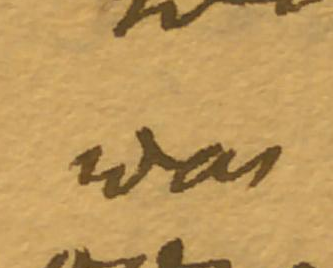was
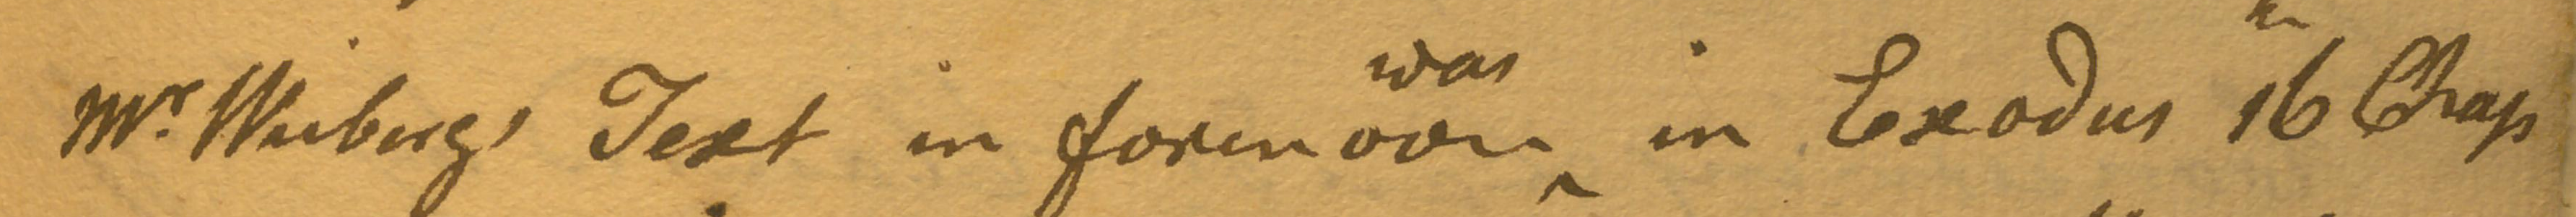M^r. Weibergs Text in forenoon ^ in Exodus 16^th Chap
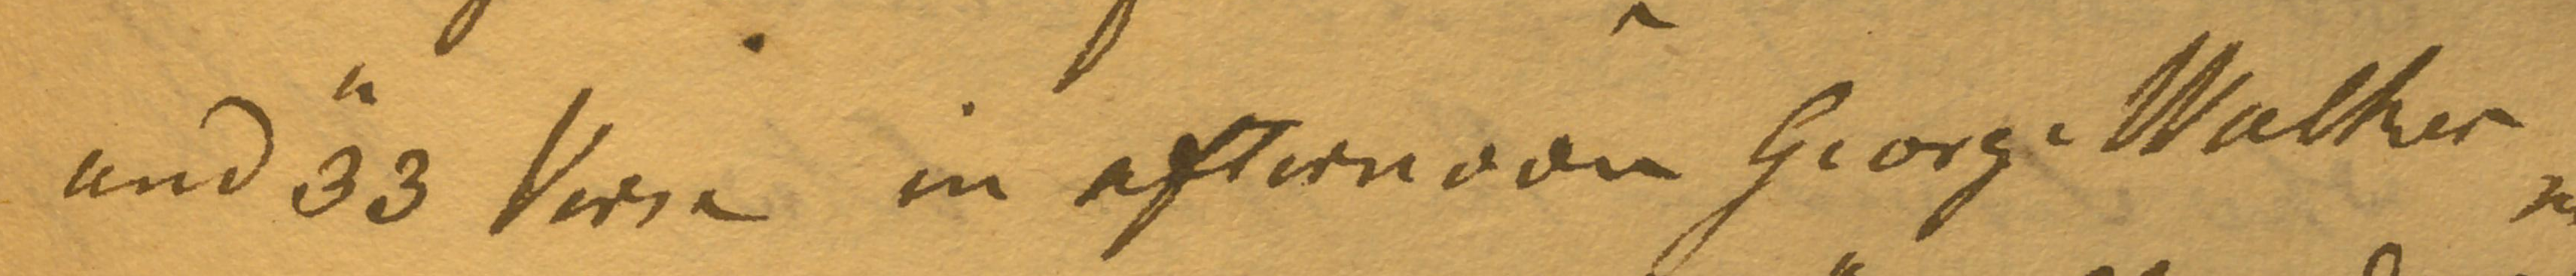and 33^th Verse in afternoon George Walker
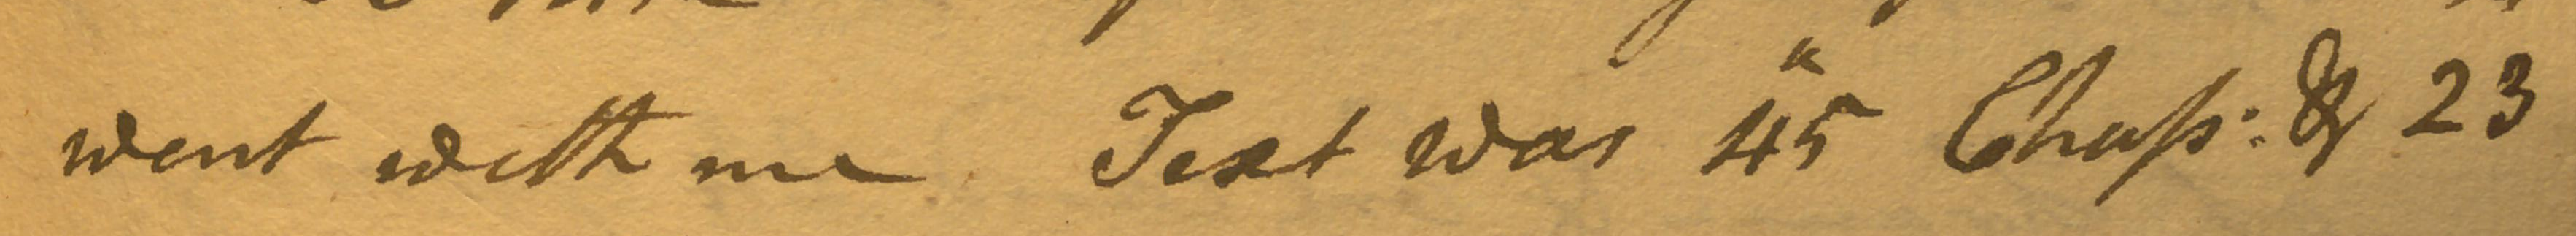went with me. Text was 45^th Chap: & 23^th
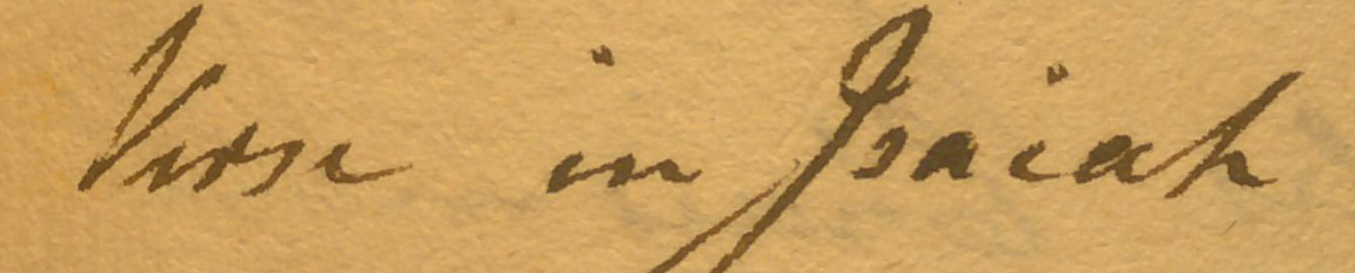Verse in Isaiah
